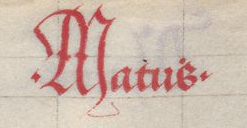.Matuṡ.
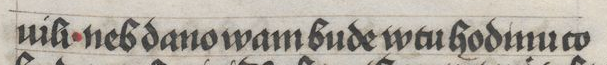uili.eb dano pram bude wtu hodinu co
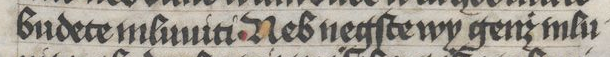budete mluuiti.Neb negſte wy genż mlu¬
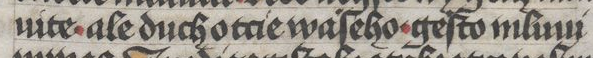uite.ale duch otcie waẛeho geẛto mluuí
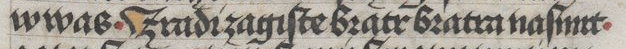w was.Zradí zagiſte bratr bratr naſmrt.
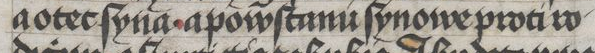a otec ſyna.a powſtanú ſynowe proti ro¬
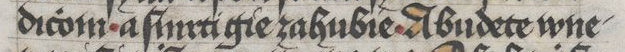diċom.a ſmrti gie zahubíe.A budetre wne¬
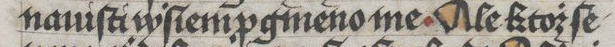nauiſti wẛiem per gmeno me.Ale ktoż ſe¬
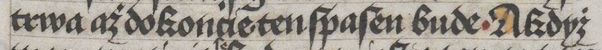trwa až dokoncie.ten ſpaſen bude.A kdyż
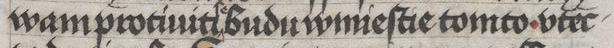wam protiuiti budu wmieſtie tomto.vtec¬
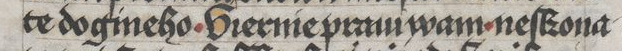te do gíneho.Viernie praui wam.neſkona¬
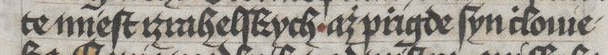te mieſt izraheſkych.aż pṙígde ſyn ċlouie¬
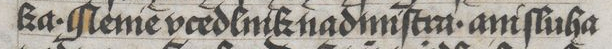ka.Neníe vcedlník nad míſtra.ani ſluha
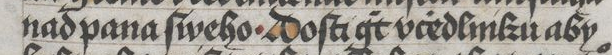nad pana ſweho.Doſti ḡt vċedlníku aby
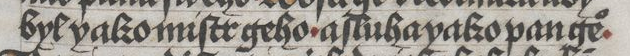byl yako miſtr geho.a ſluha yako pan ḡeo.
